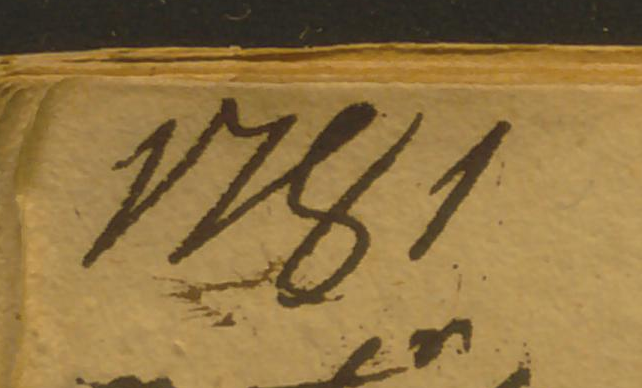1781
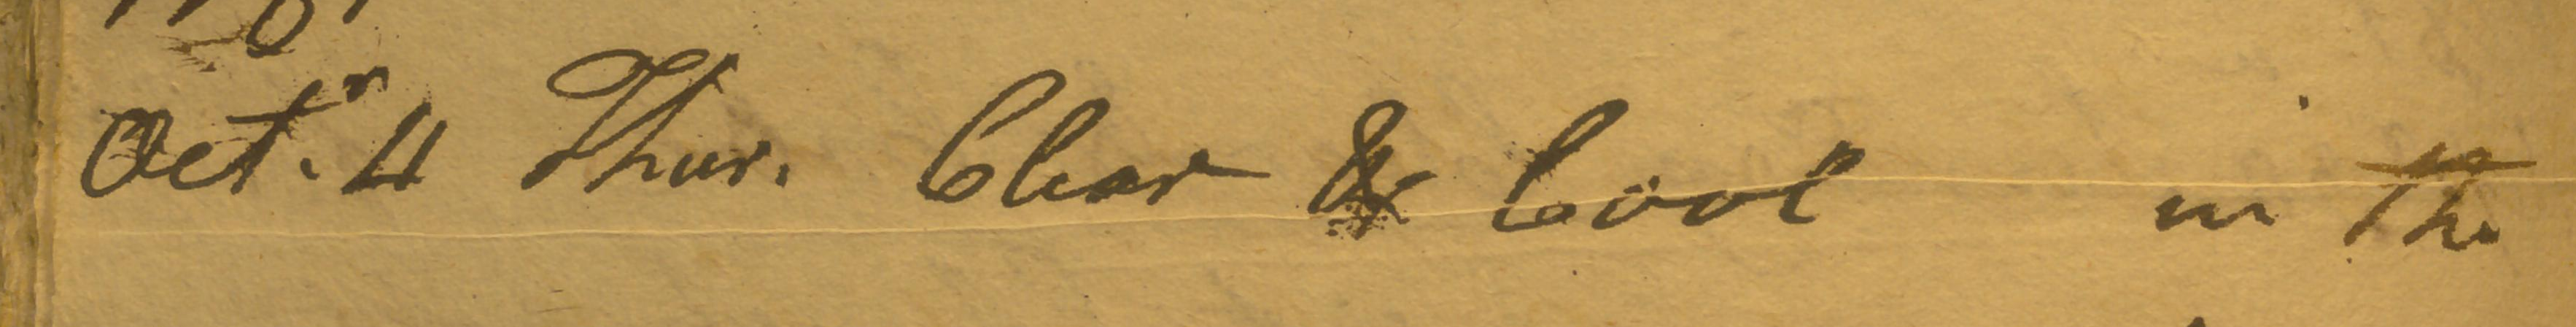Oct^r. 4 Thur. Clear & Cool in the
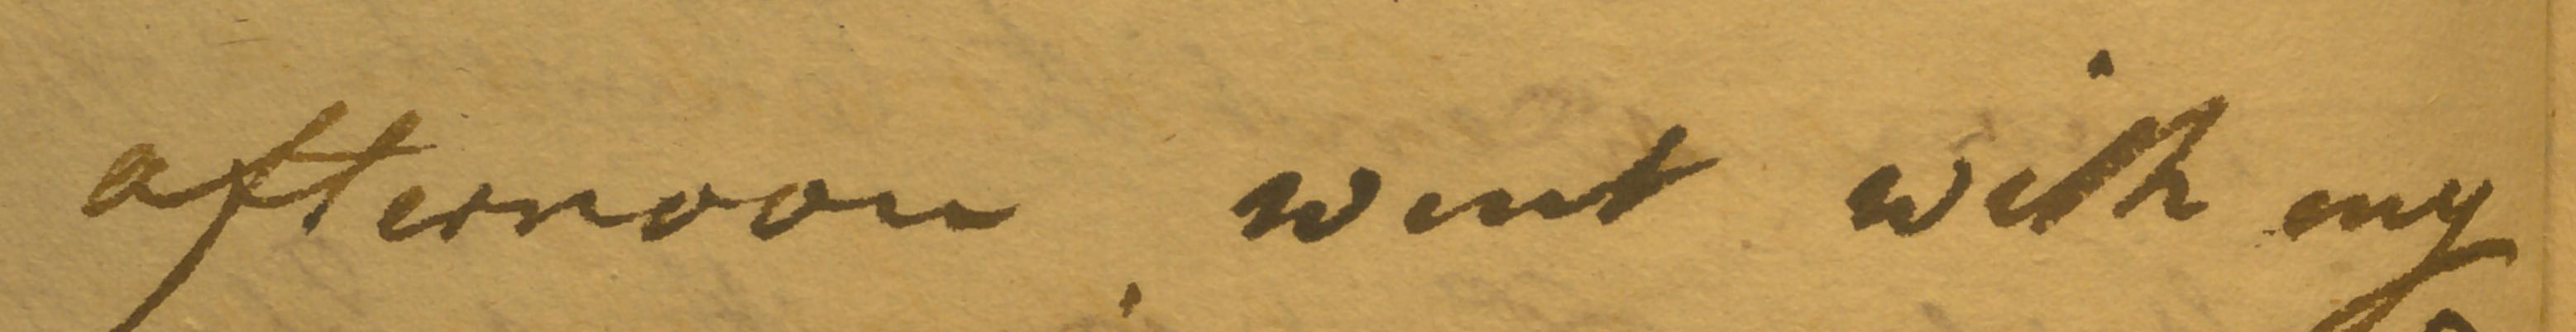afternoon went with my
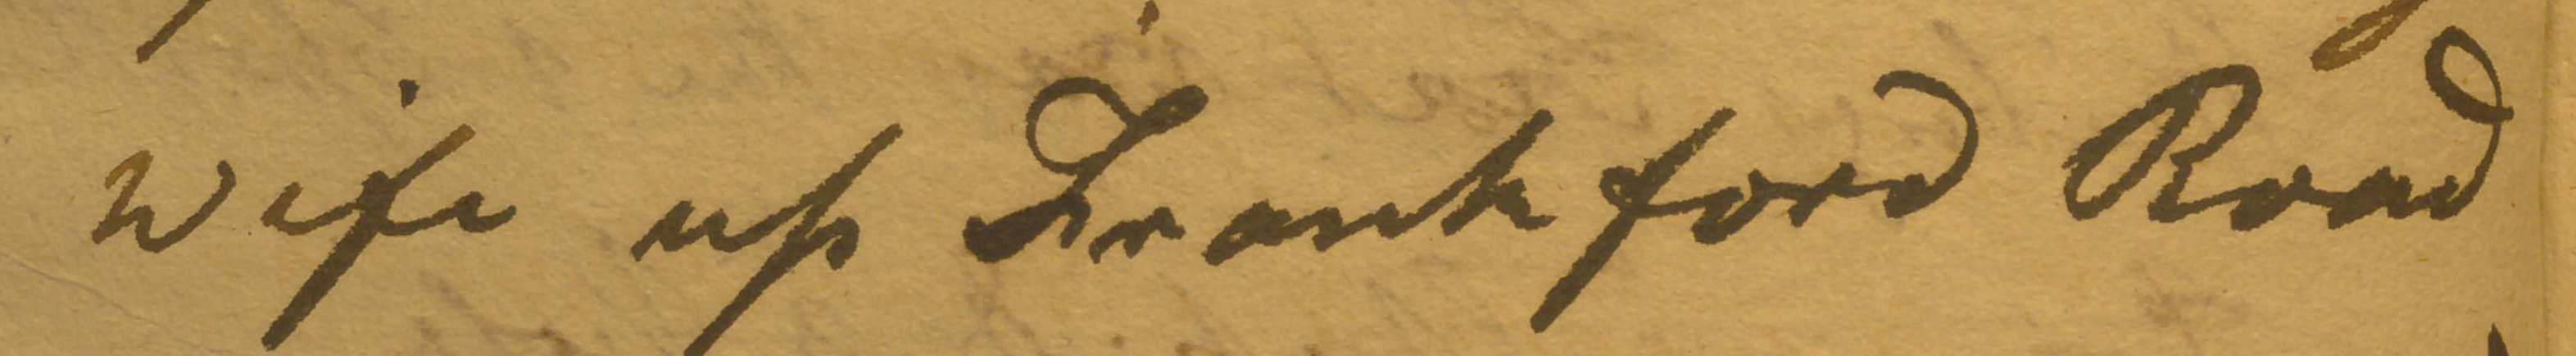wife up Frankford Road
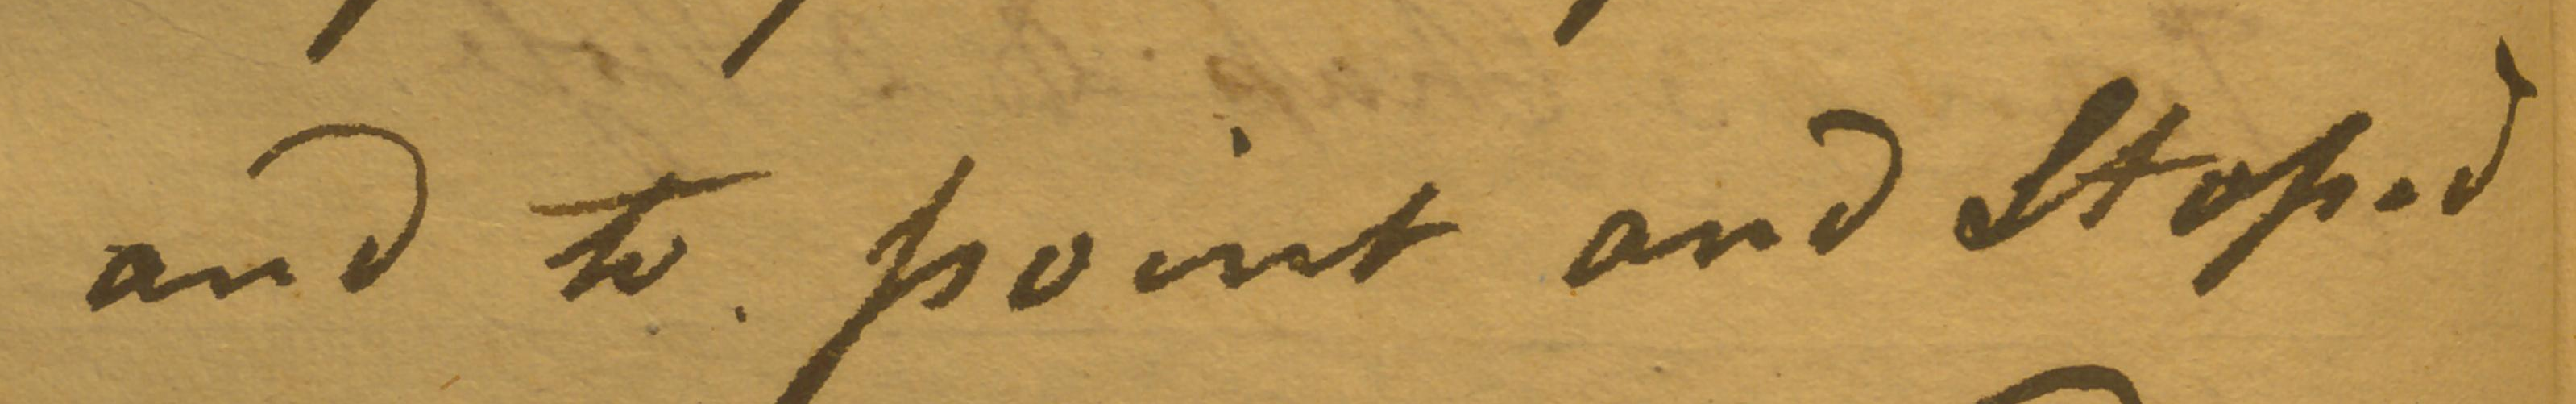and to point and Stoped
